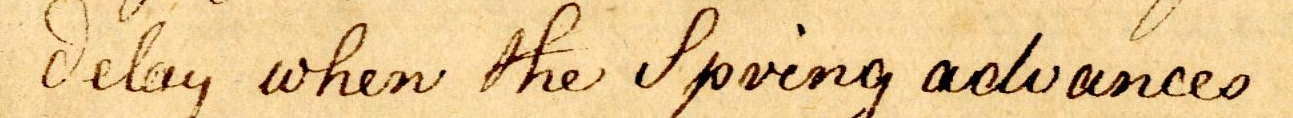delay when the Spring advances
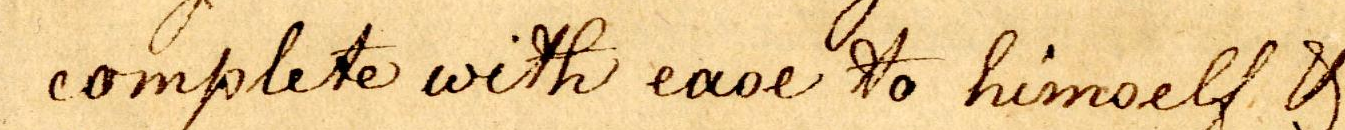complete with ease to himself &
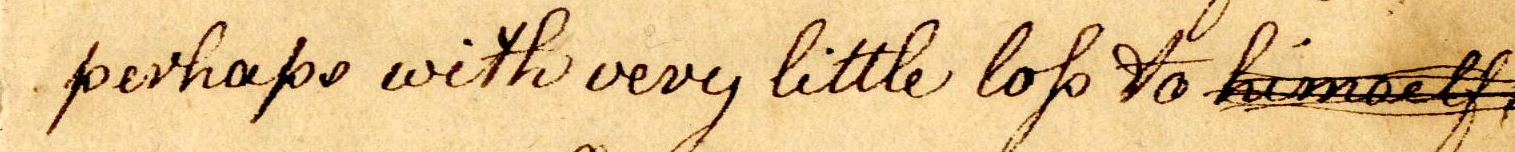perhaps with very little loss to [himself]
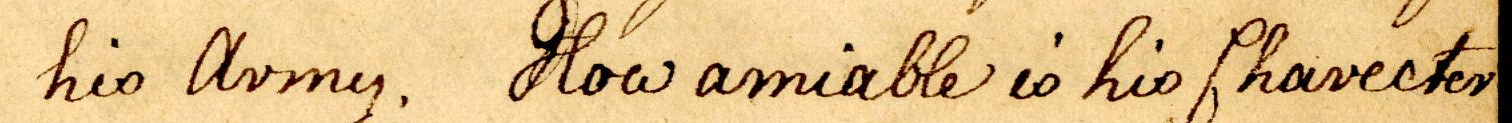his Army, How amiable is his Character
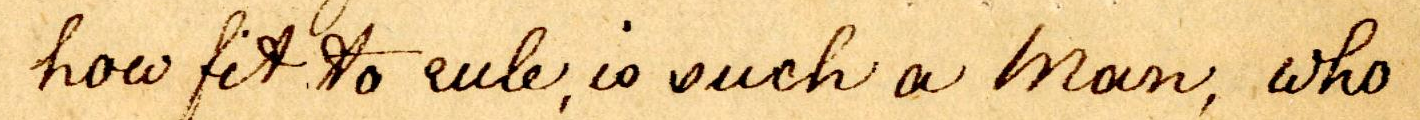how fit to rule, is such a Man, who
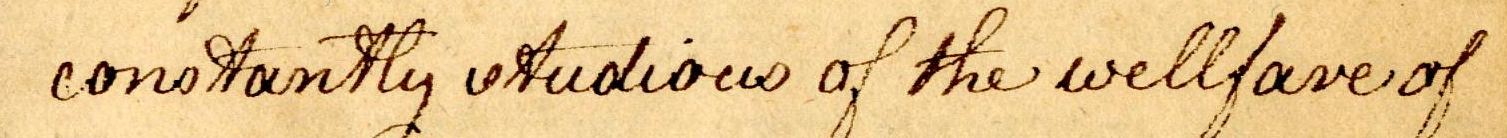constantly studious of the wellfare of
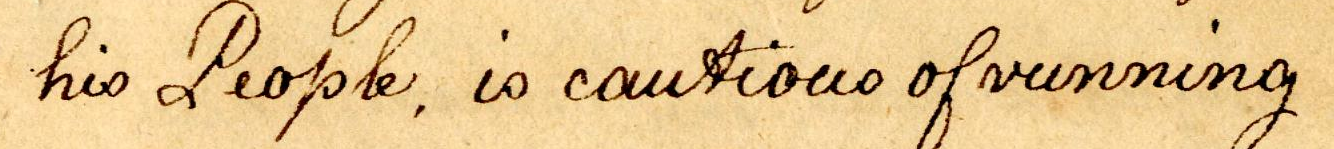his People, is cautious of running
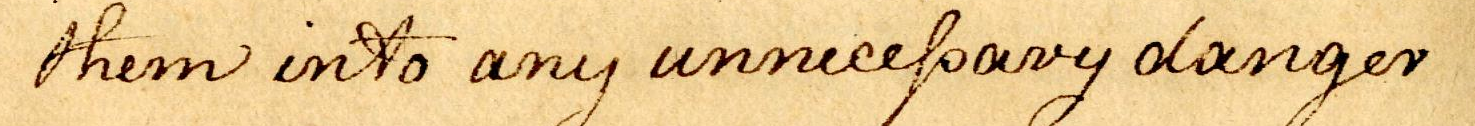them into any unnecessary danger
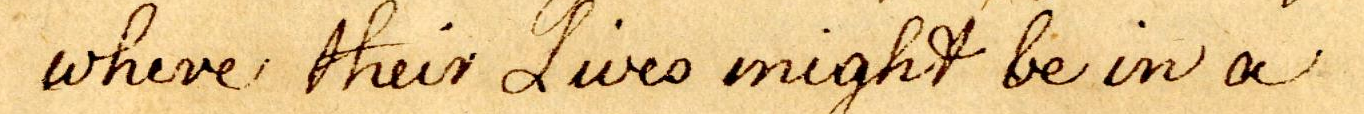where their Lives might be in a
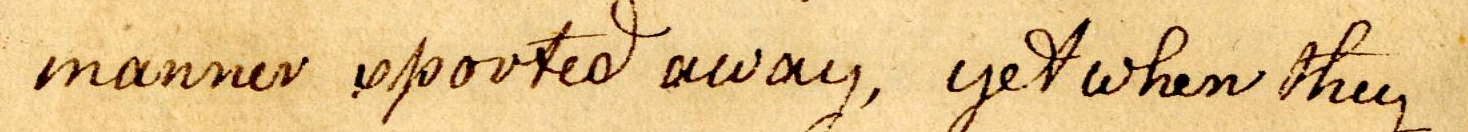manner sported away, yet when they
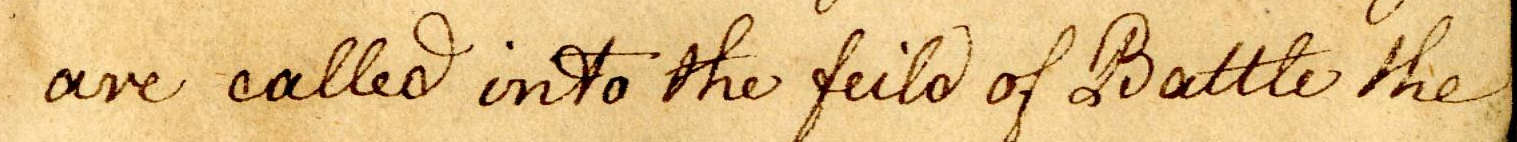are called into the feild of Battle the
